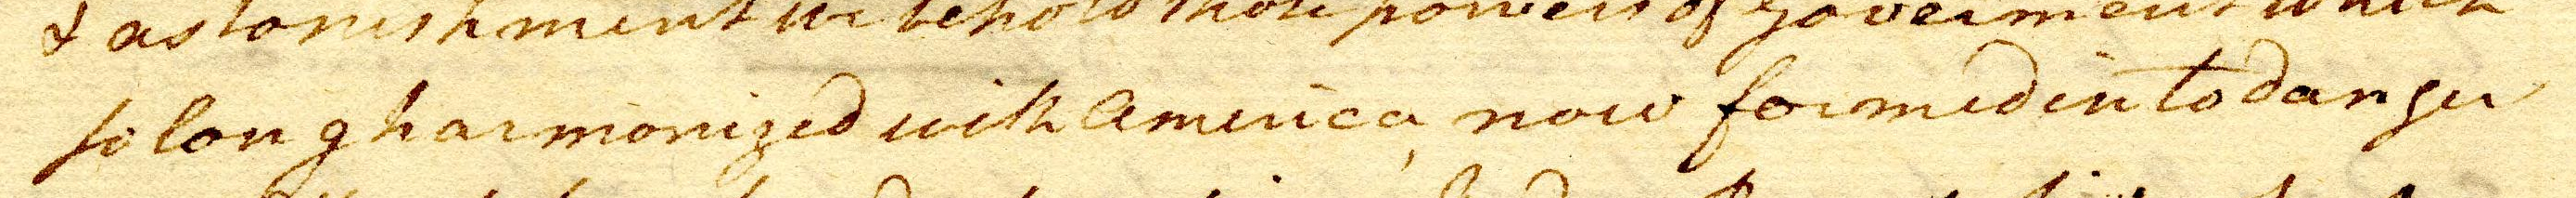so long harmonized with America, now formed in to danger
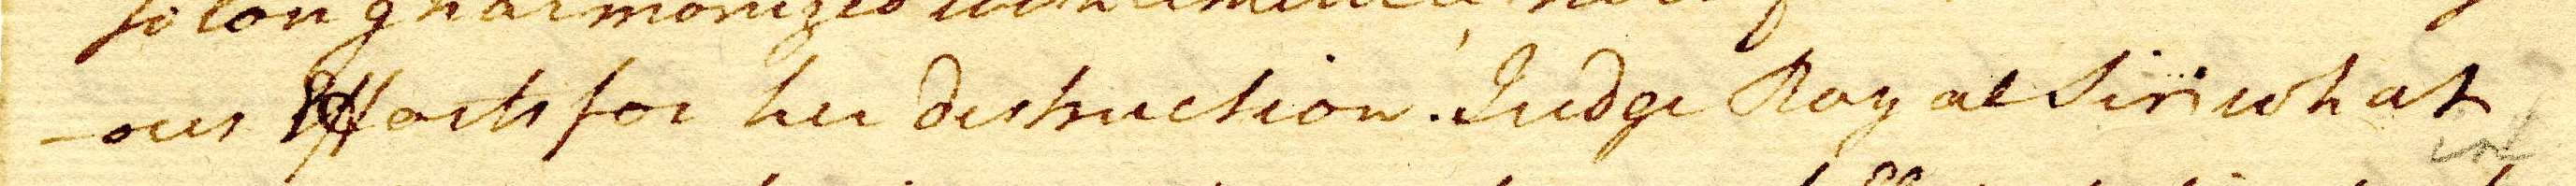-ous Efforts for her destruction. Judge Royals in what
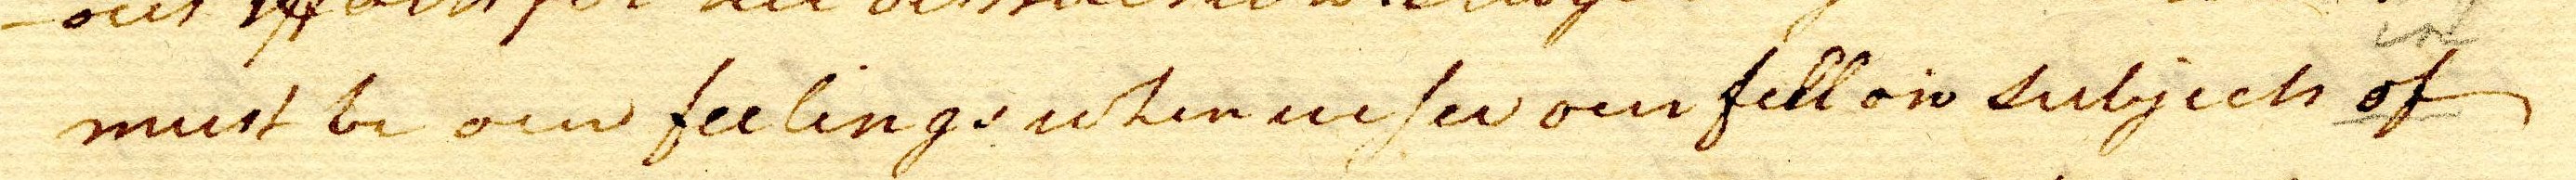must be our feelings when we see our fell ow subjects of
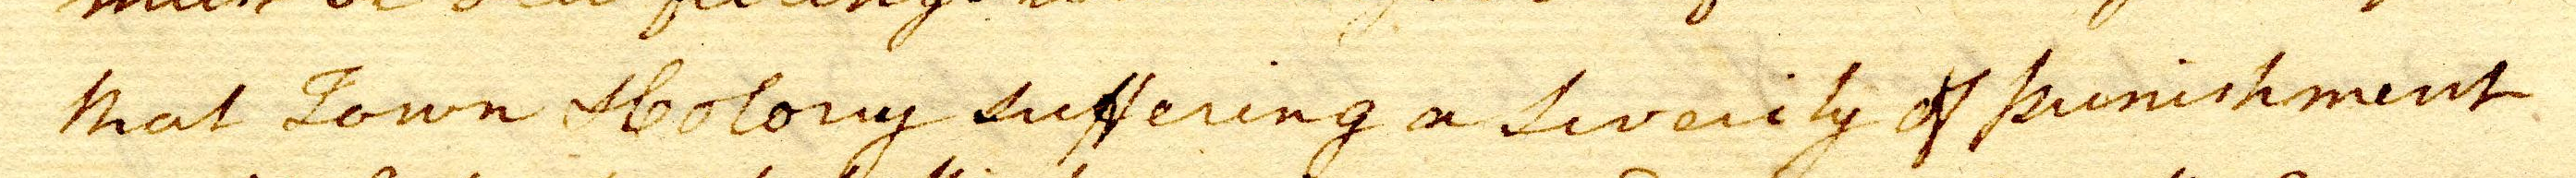that Town & Colony suffering a Severity of punishment
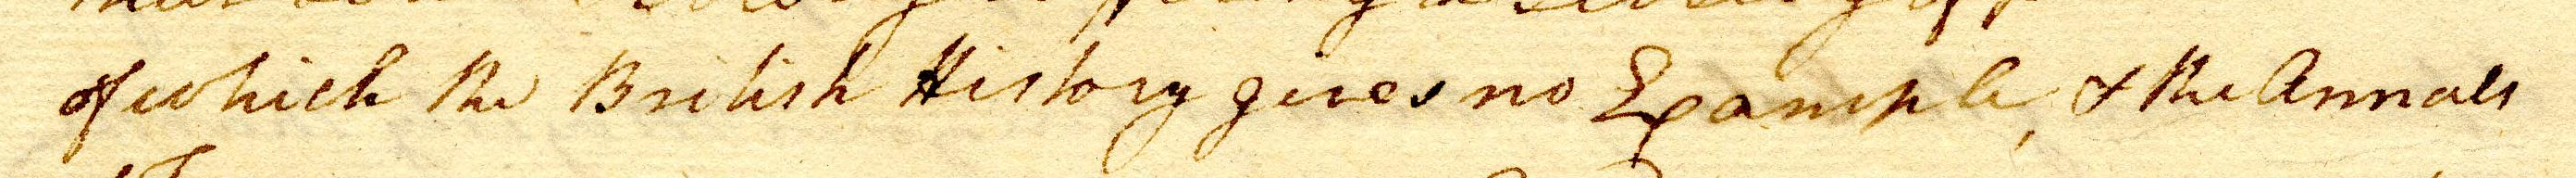of which the British History gives no Example & the Annals
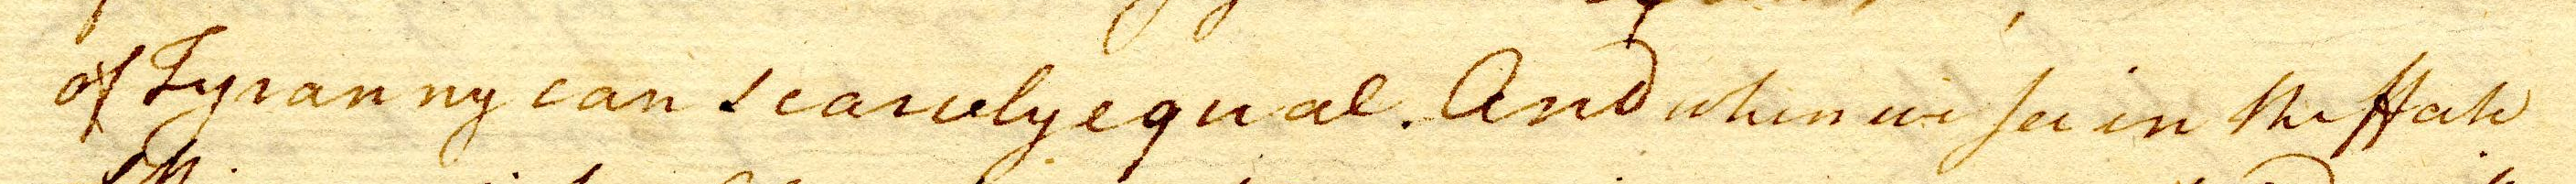of Tyranny can scarcely equal. And when we see in the state
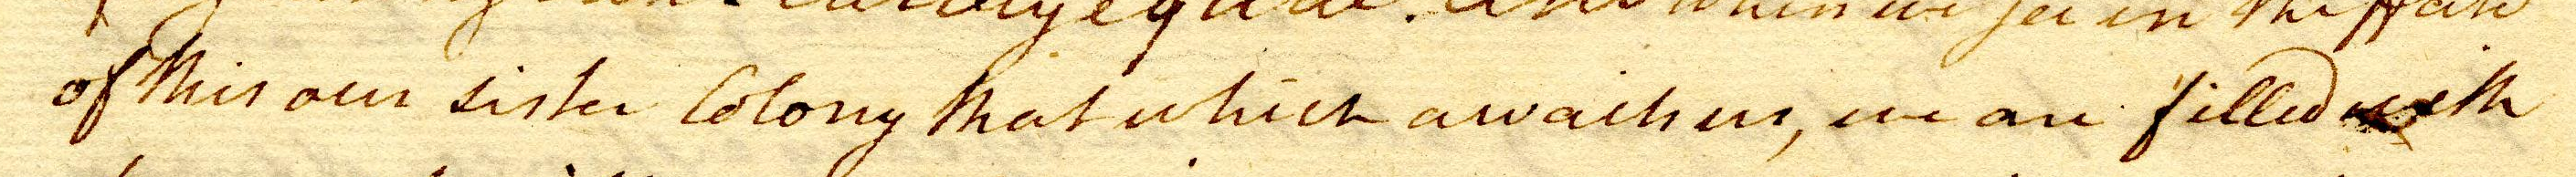of this our sister Colony that which awaits us, we are filled with
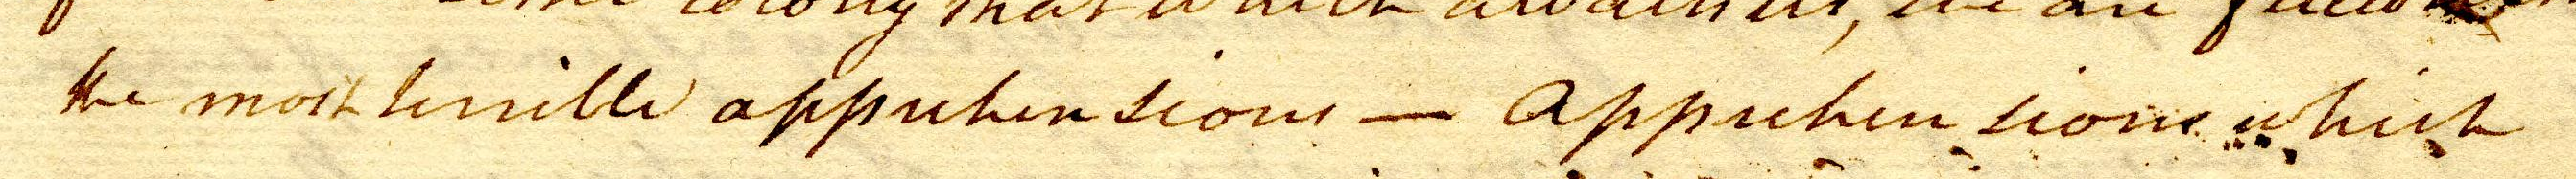the most terrible apprehensions- Apprehensions which
